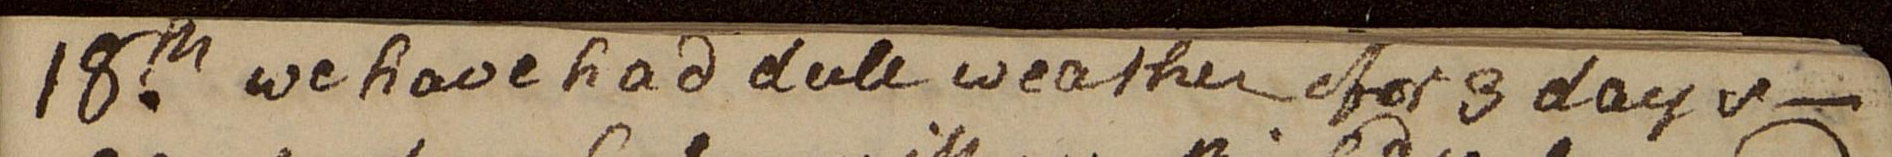18^th. we have had dull weather for 3 days-
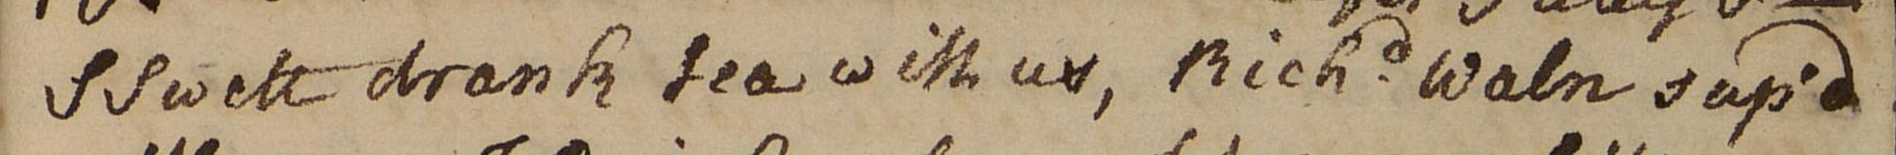S Swett drank tea with us, Rich^d. Waln sup'd
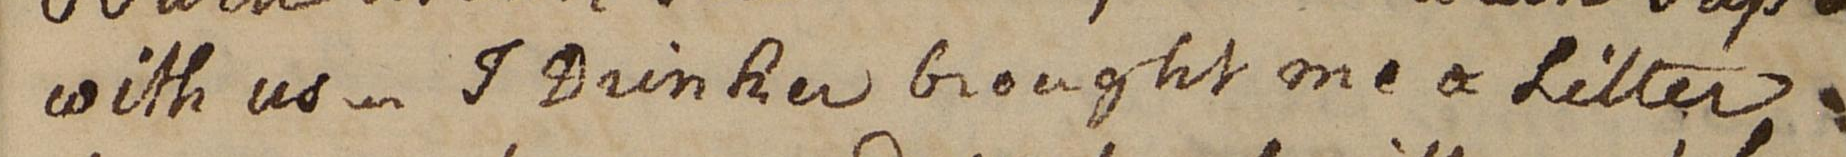with us- I Drinker brought me a Litter
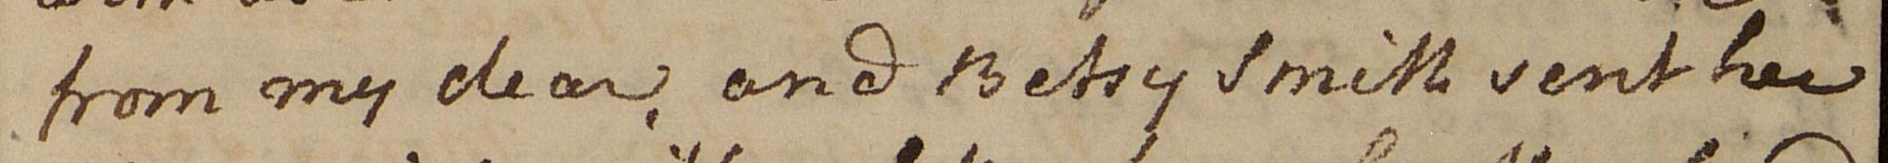from my dear and Betsy Smith sent her
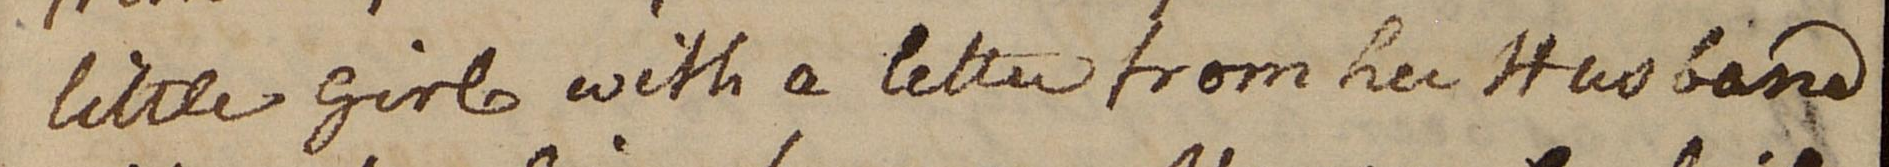little girl with a letter from her Husband
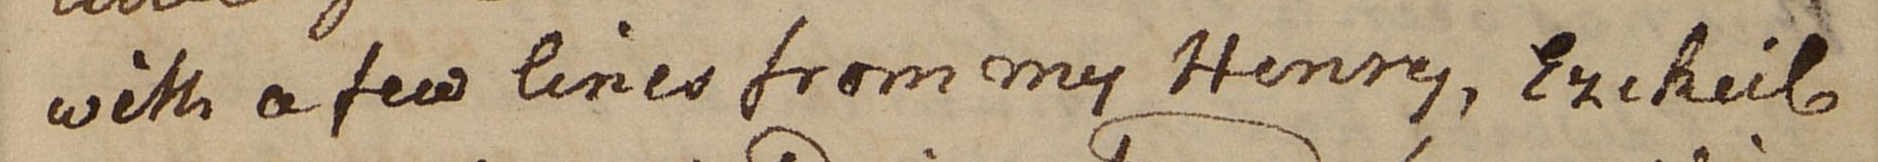with a few lines from my Henry, Ezekeil
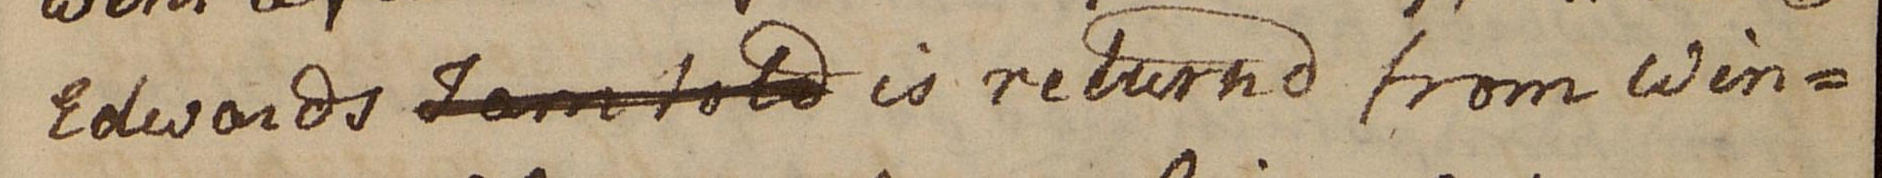Edwards [I am told] is returnd from Win-
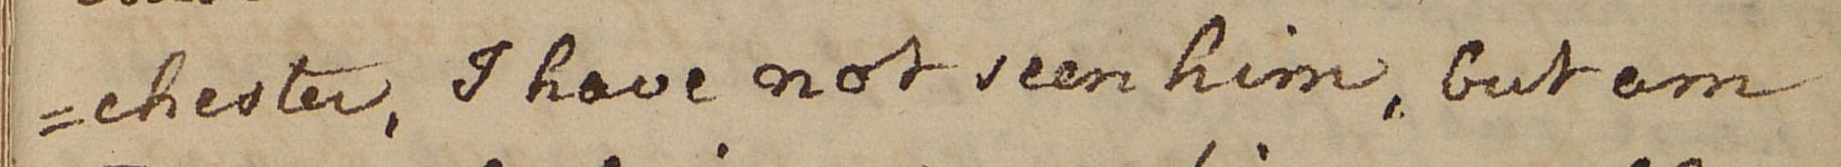-chester, I have not seen him, but am
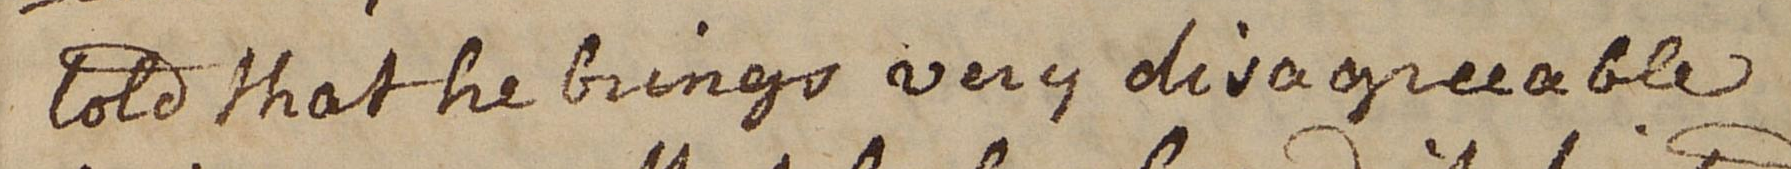told that he brings very disagreeable
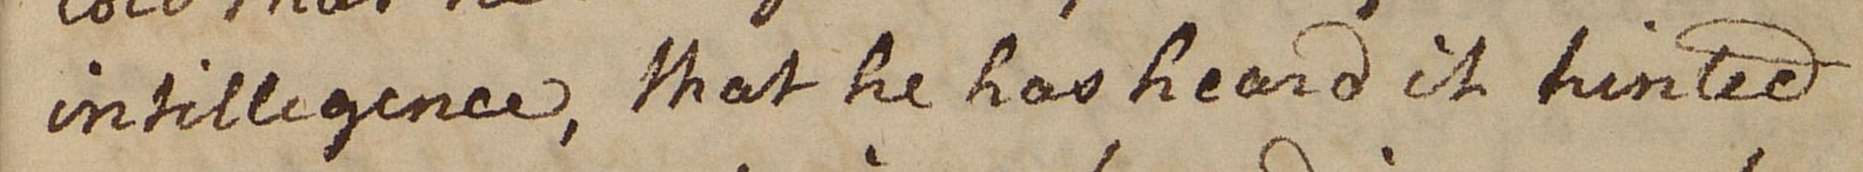intilligence, that he has heard it hinted
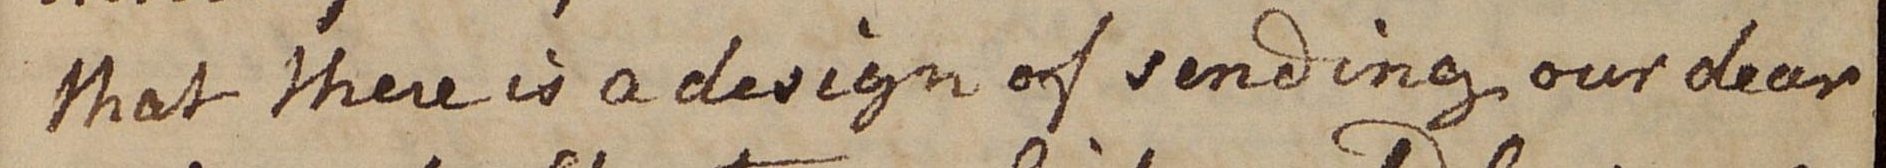that there is a design of sending our dear
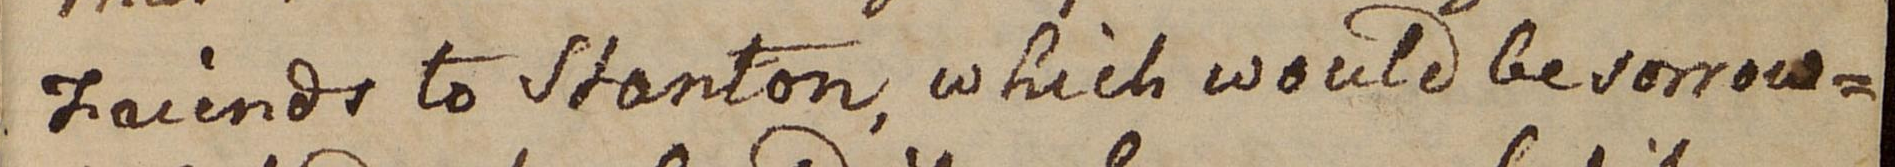Friends to Stanton, which would be sorrow-
